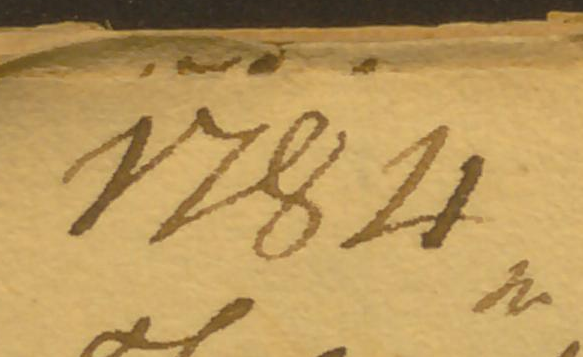1784
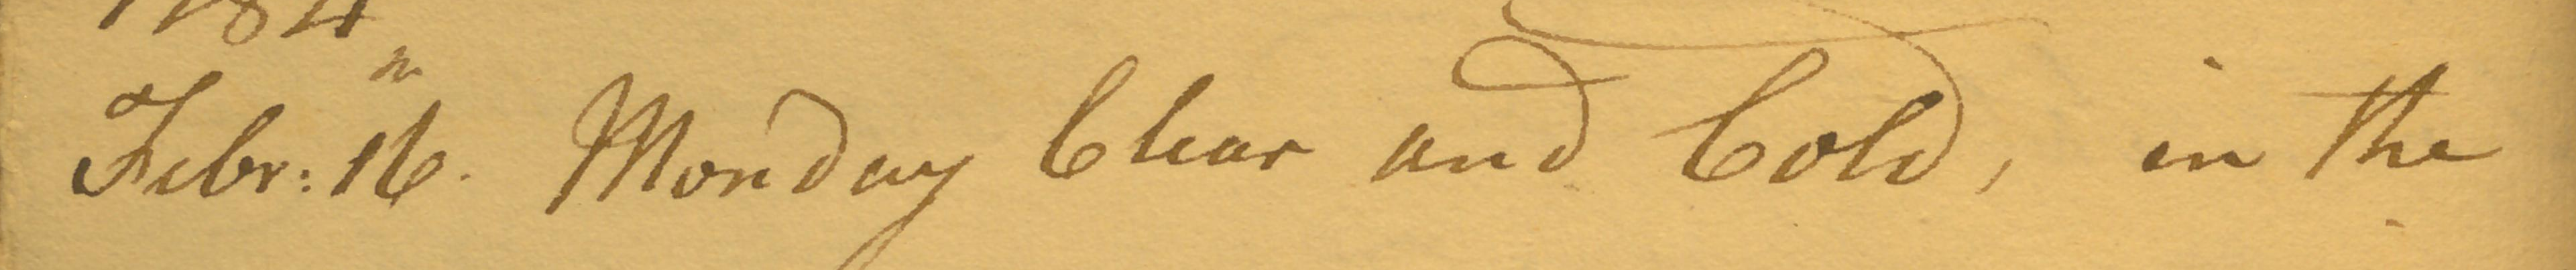Febr. 16^th. Monday Clear and Cold, in the
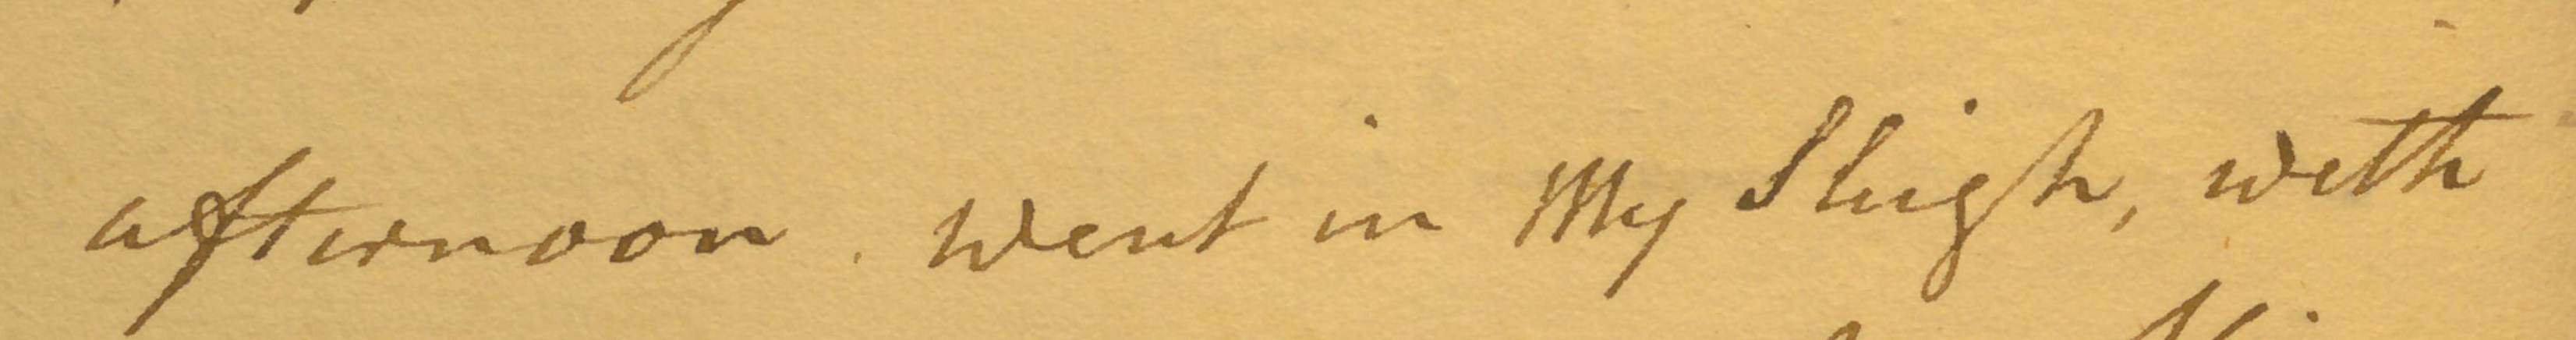afternoon, went in My Sleigh, with
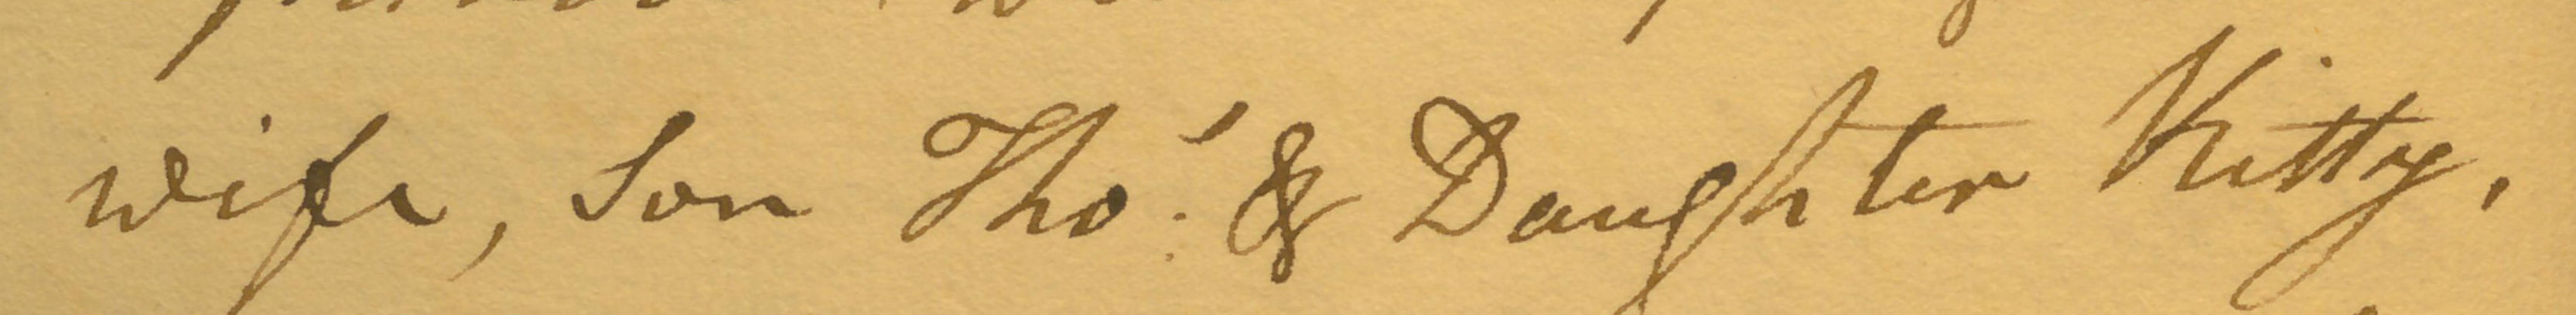wife, Son Tho^s. & Daughter Kitty,
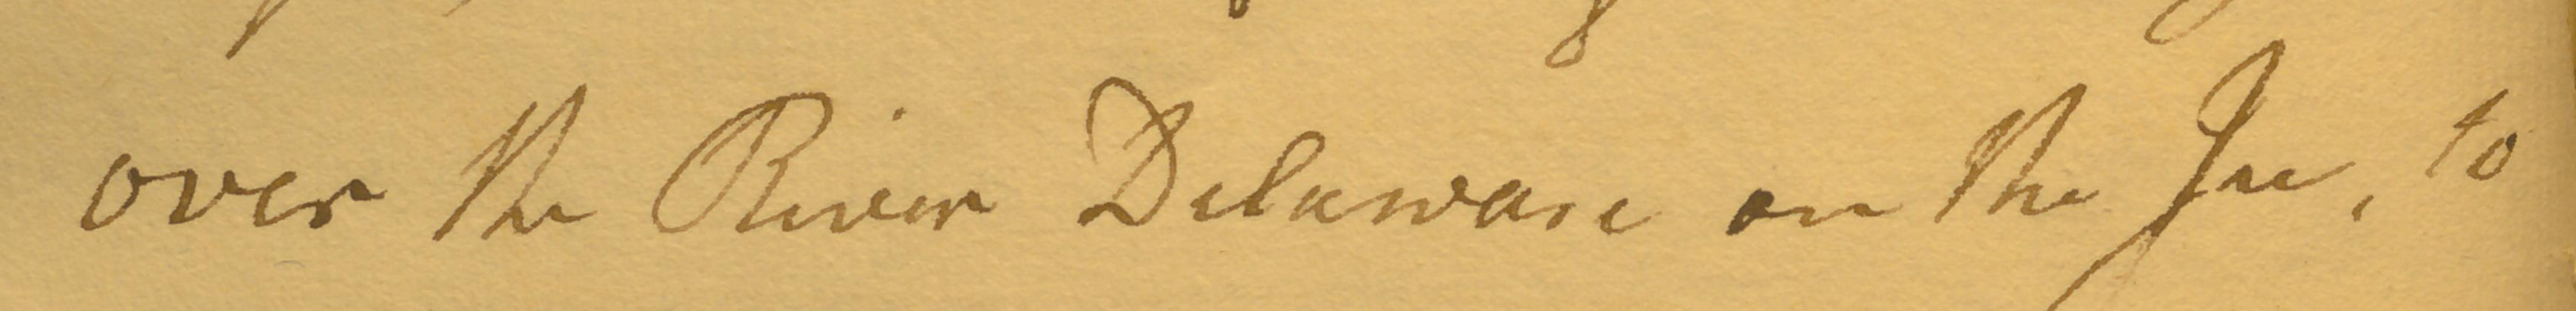over the River Delaware on the Ice, to
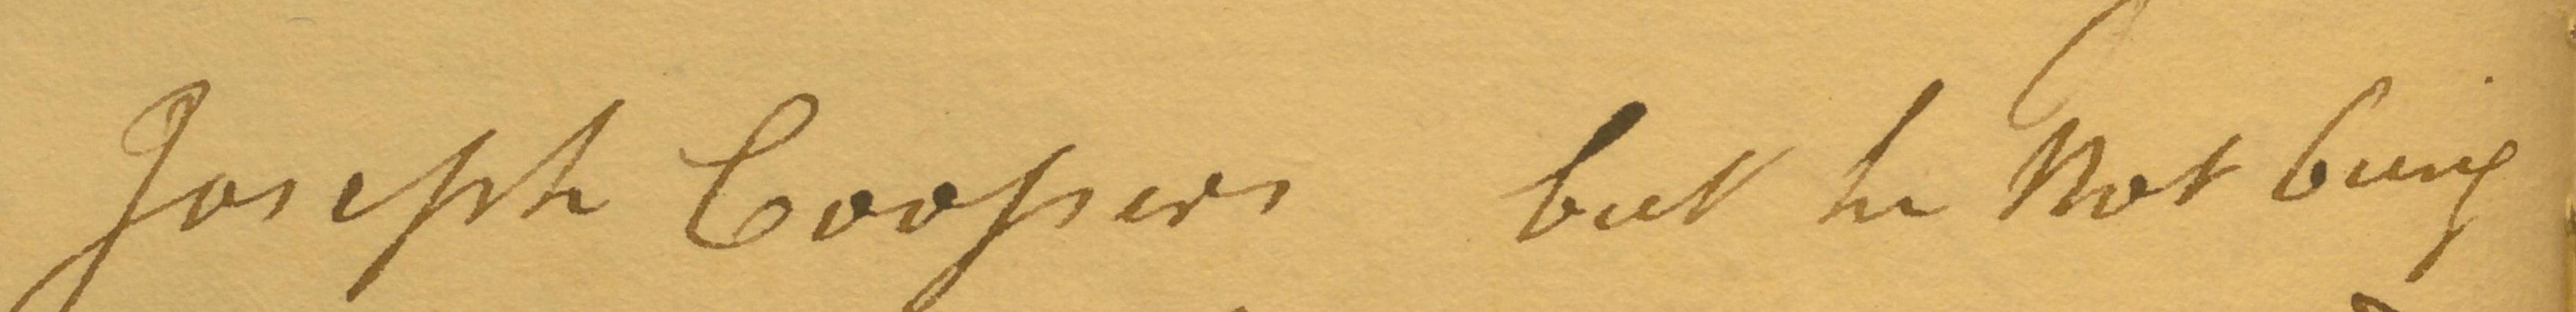Joseph Coopers but he not being
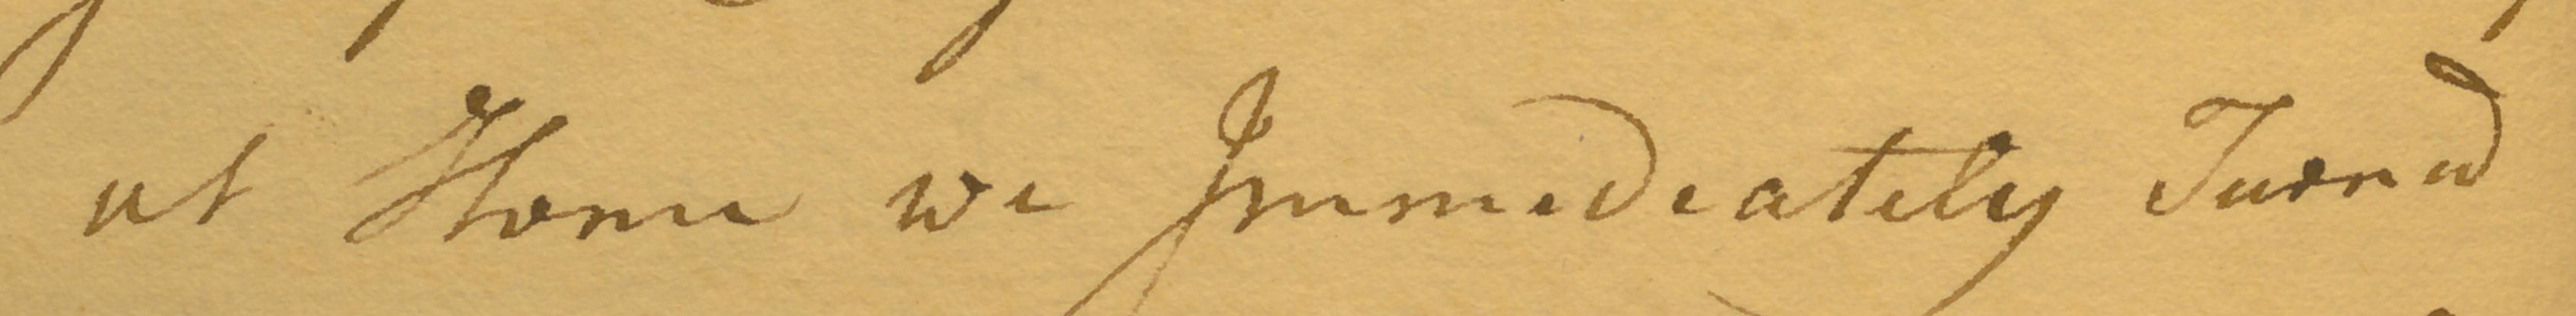at Home we Immediately Turned
